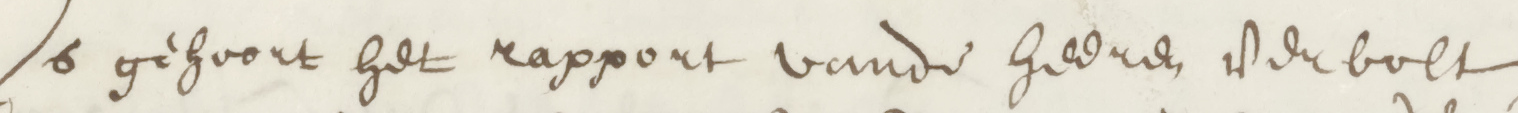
Is gehoort het rapport vande heeren Verbolt
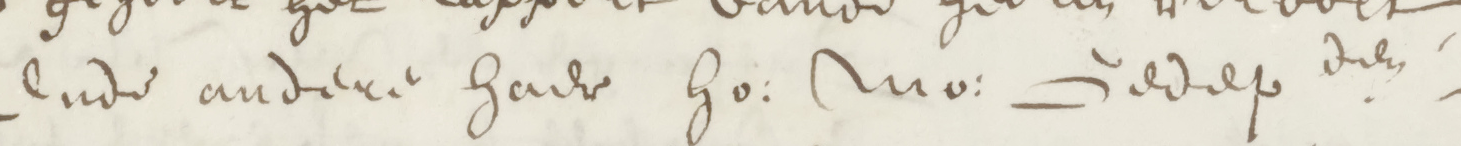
ende andere haer Ho:Mo: Gedepden
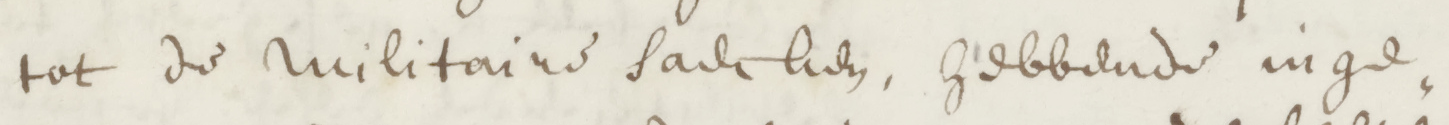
tot de militaire saecken, hebbende inge„
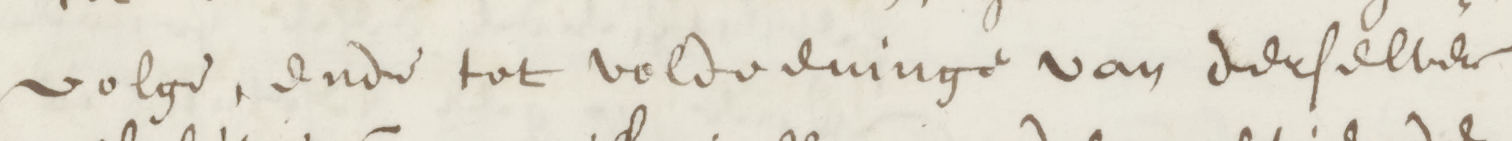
volge, ende tot voldoeninge van derselver
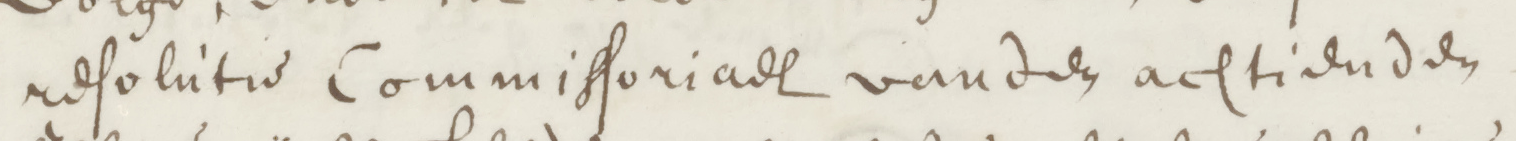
resolutie Commissoriael van den achtienden
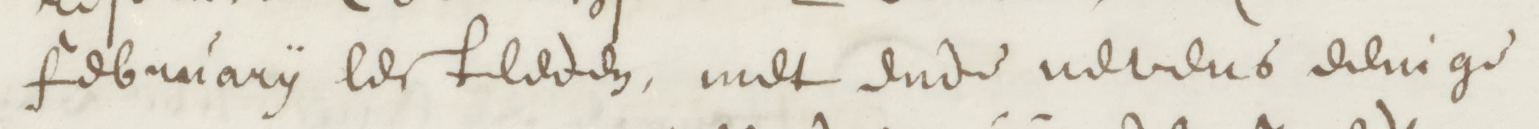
februarij lestleden, met ende nevens eenige
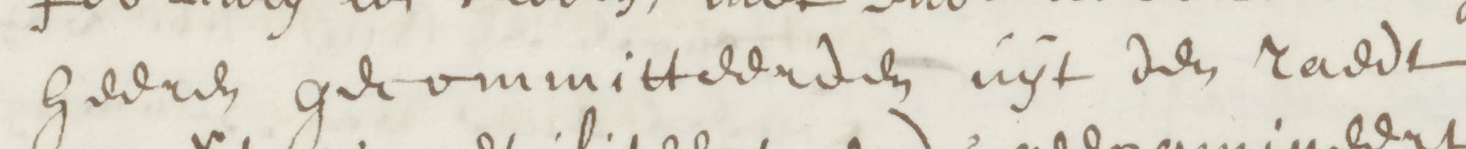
heeren gecommitteerden uijt den raedt
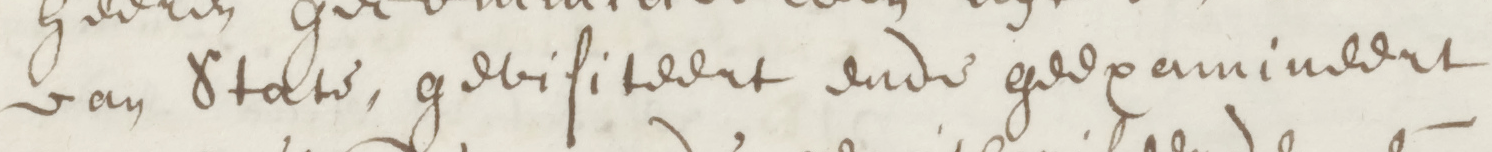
van State, gevisiteert ende geexamineert
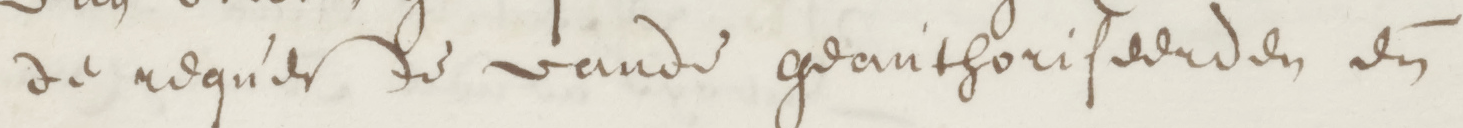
de requeste vande geauthoriseerden en
